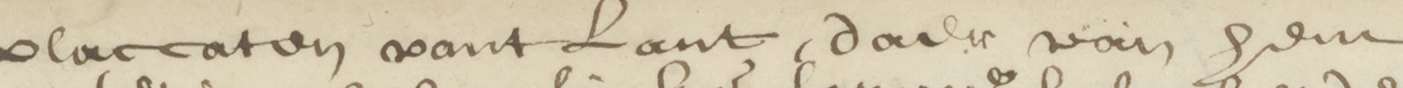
placcaten vant Lant, daer van hem
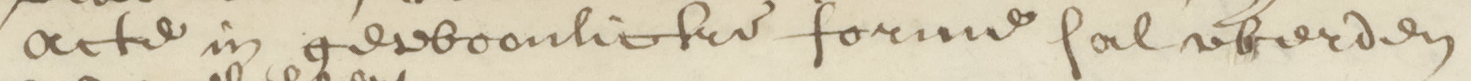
acte in gewoonlicke forme sal werden
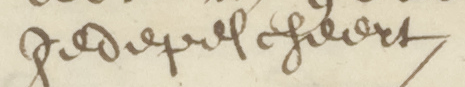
gedepescheert.
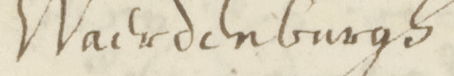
Waerdenburgh
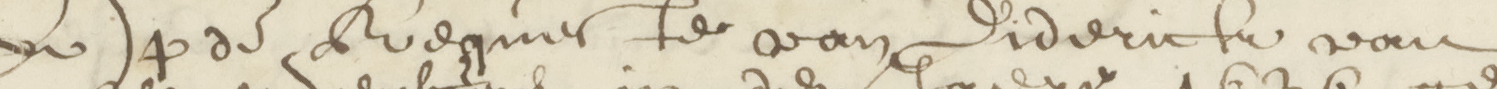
Op den Requeste van Diderick van
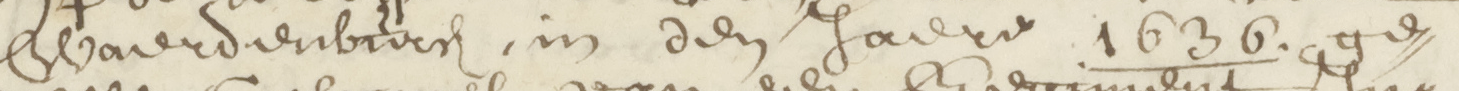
Waerdenburch, in den Jaere 1636. ge„
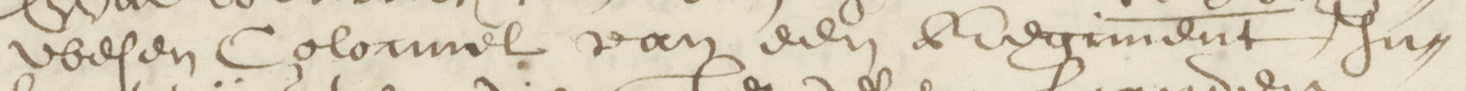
wesen Colonnel van een Regiment In„
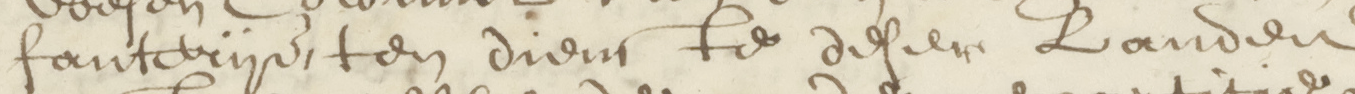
fanterije, ten dienste deser Landen
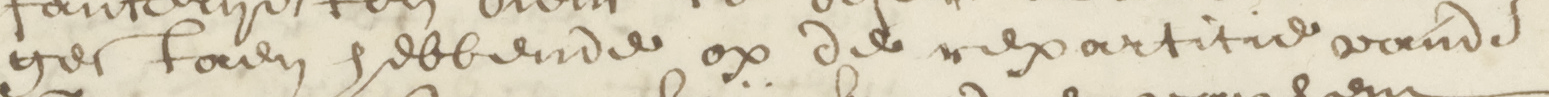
gestaen hebbende op de repartitie vande
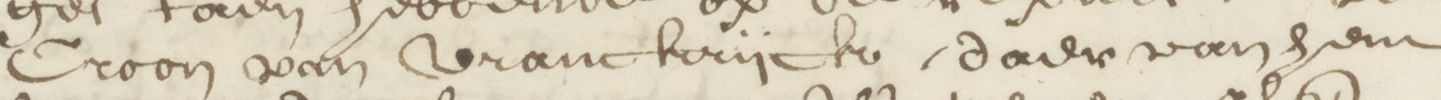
Croon van Vranckrijck, daer van hem
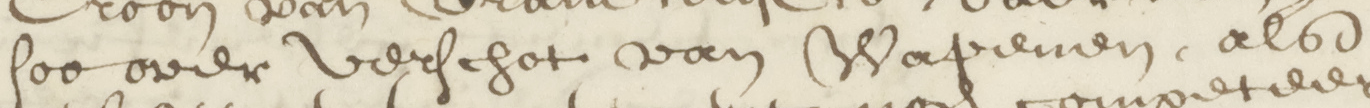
soo over verschot van Wapenen, als
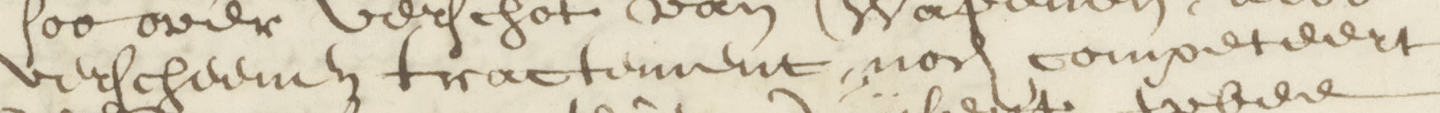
verscheenen tractement, noch competeert
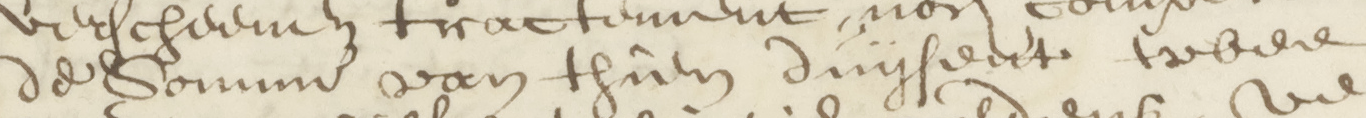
de Somme van thien duijsent twee
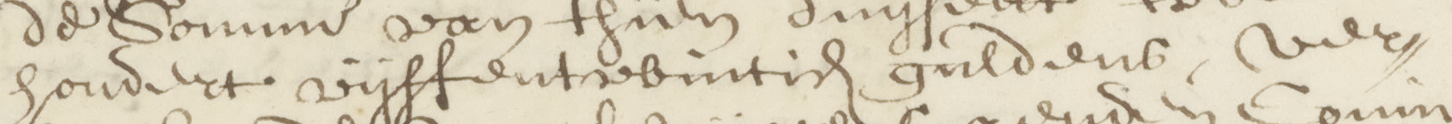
hondert vijffentwintich guldens, ver„
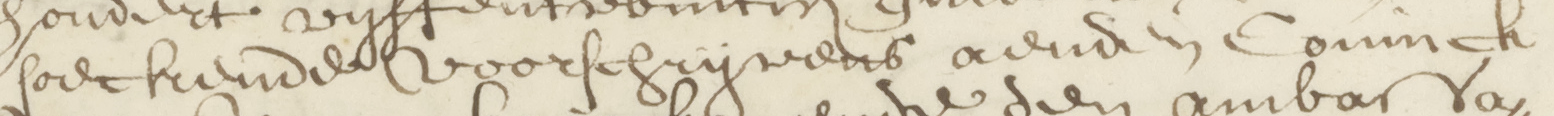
soeckende voorschrijvens aenden Coninck
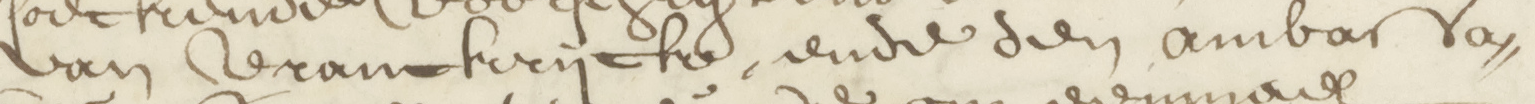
van Vranckrijck, ende den ambassa„
